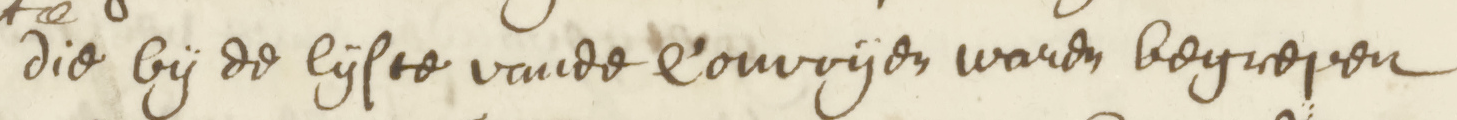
die bij de lijste vande convoijen waren begrepen
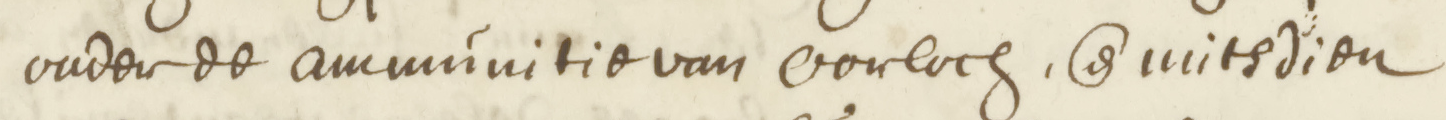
onder de ammunitie van Oorloch, en mitsdien
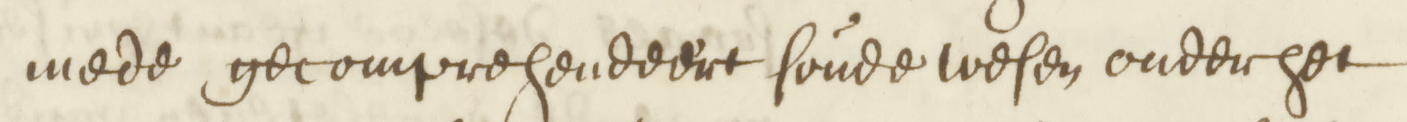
mede gecomprehendeert soude wesen onder het
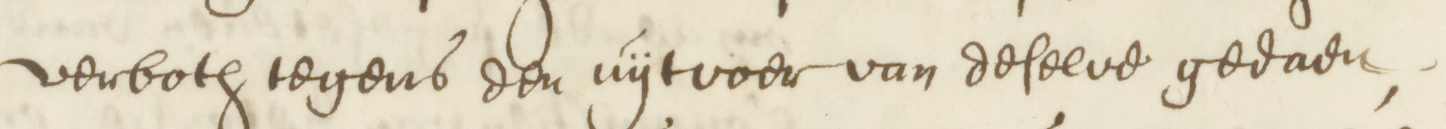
verboth tegens den uijtvoer van deselve gedaen,
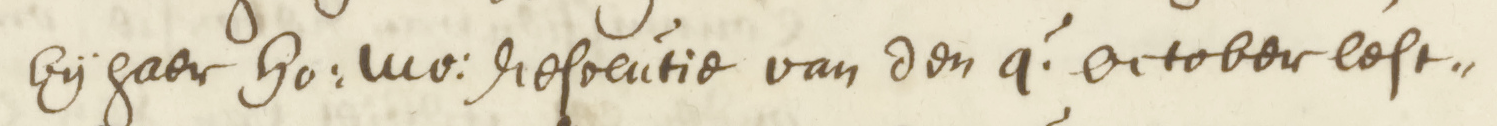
bij haer ho:mo: resolutie van den 4e october lest„
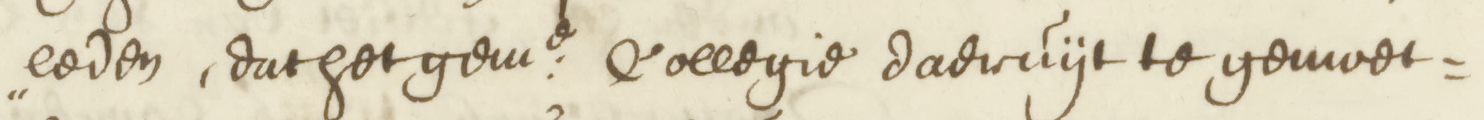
„leden, dat het geme: Collegie daeruijt te gemoet„
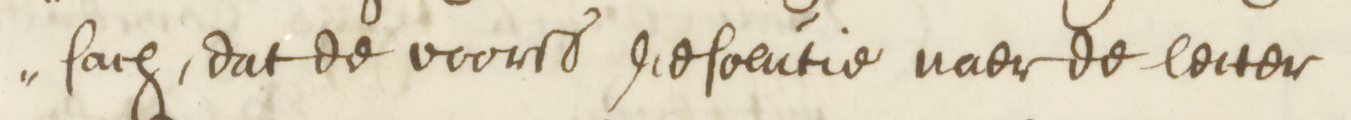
„sach, dat de voors resolutie naer de letter
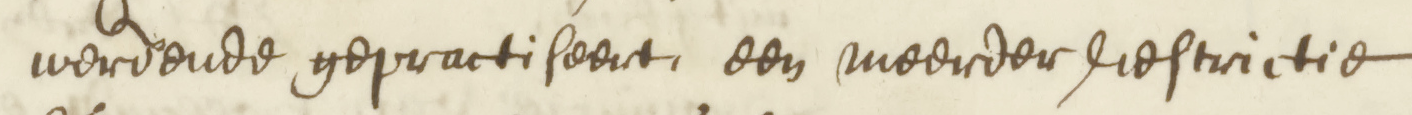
werdende gepractiseert, een meerder restrictie
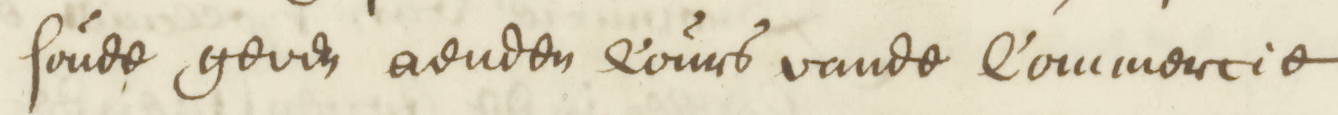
soude geven aenden Cours vande Commercie
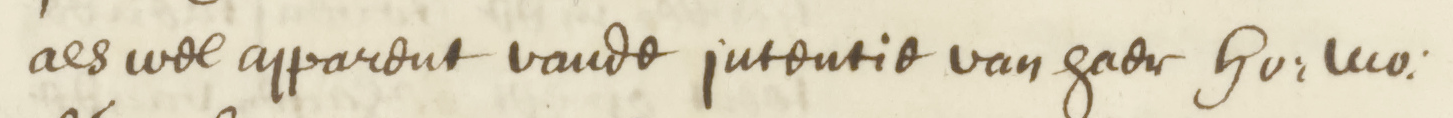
als wel apparent vande intentie van haer Ho:Mo:
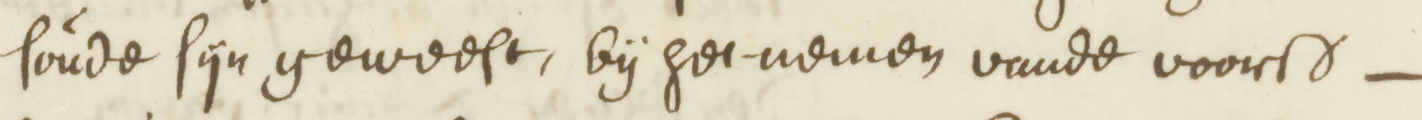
soude sijn geweest, bij het nemen vande voors
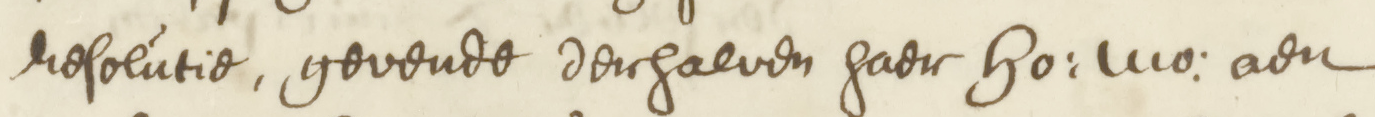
resolutie, gevende derhalven haer Ho:Mo: aen
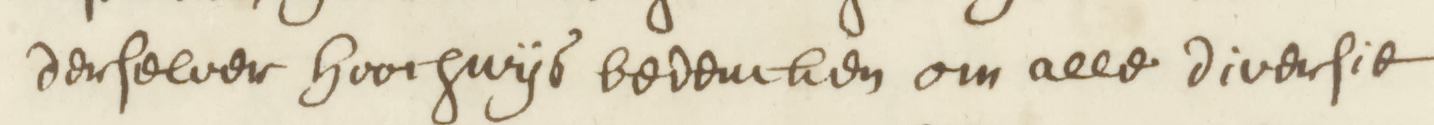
derselver hoochuijs bedencken om alle diversie
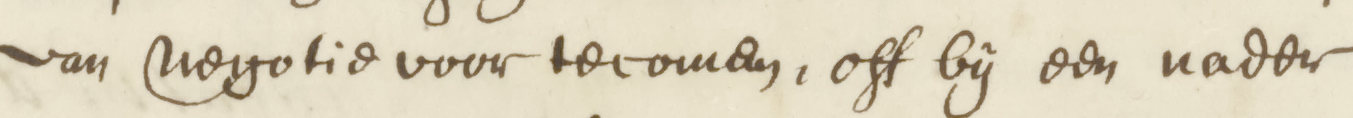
van negotie voor te comen, off bij een nader
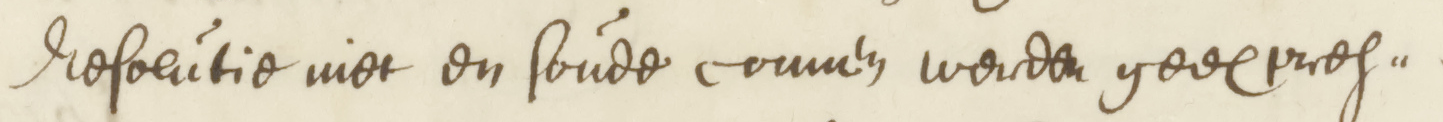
resolutie niet en soude connen werden geexpres„
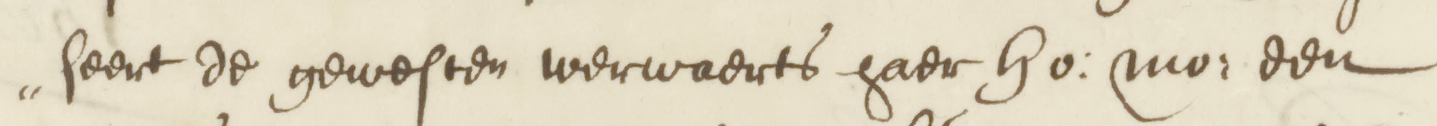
„seert de gewesten werwaerts haer Ho:mo: den
